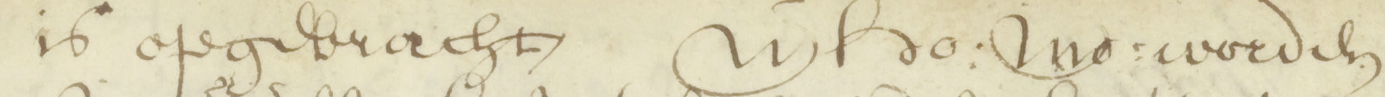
is opgebracht, U Ho:Mo: worden
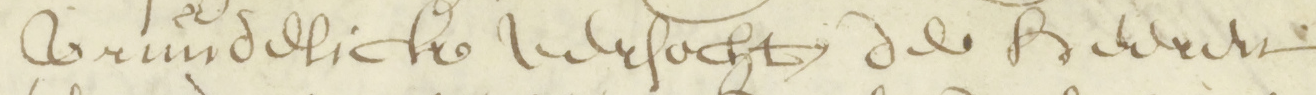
vrundelick versocht, de Heeren
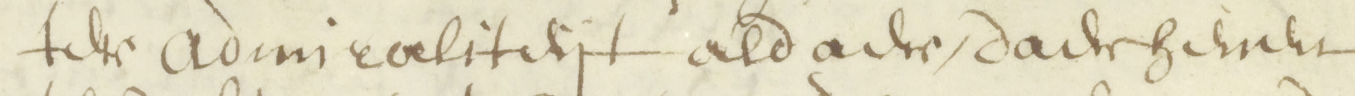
ter Admiraliteijt aldaer, daerhenen
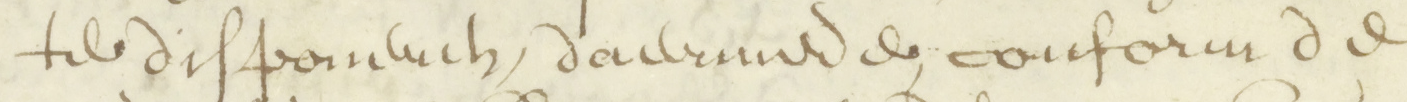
te disponeren, daermede, conform de
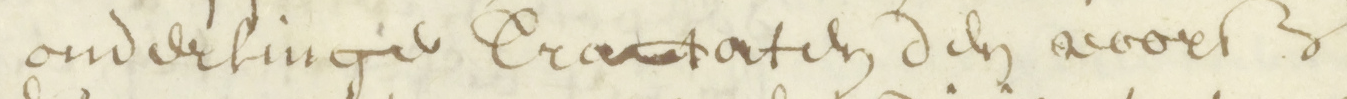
onderlinge Tractaten den voorsz
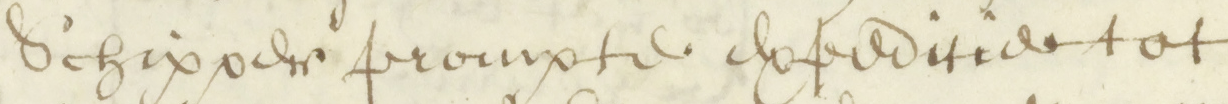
Schipper prompte expeditie tot
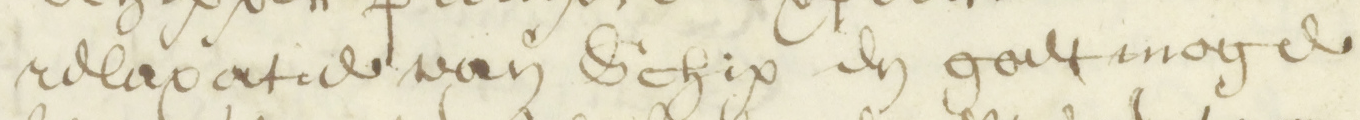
relaxatie van Schip en goet moge
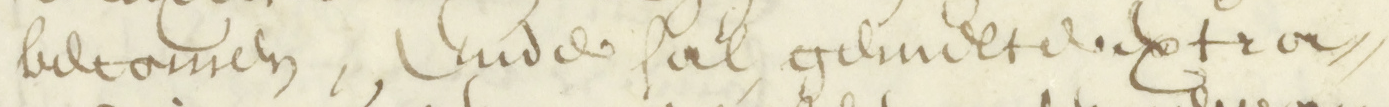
becomen, Ende sal gemelte Extra,,
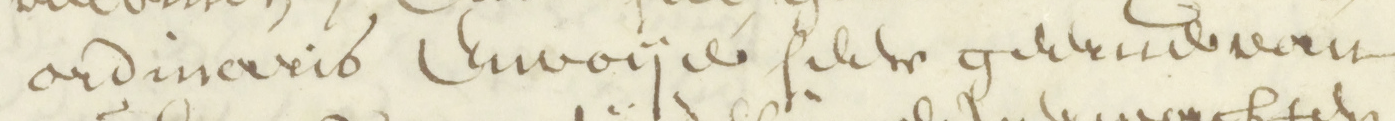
ordinaris Envoijé seer geerne van
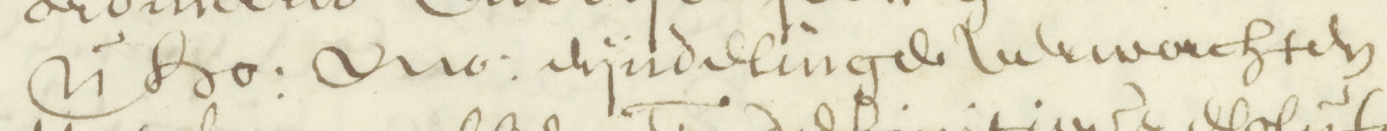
U Ho:Mo: eijndelinge verwachten
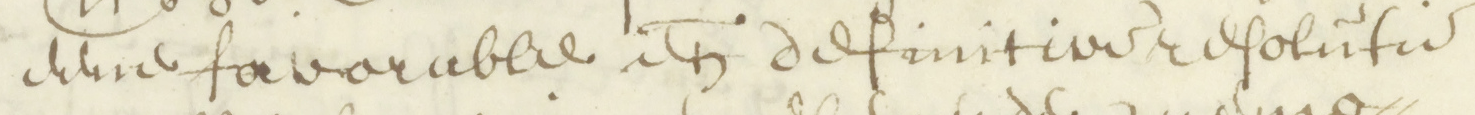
eene favorable en definitive resolutie
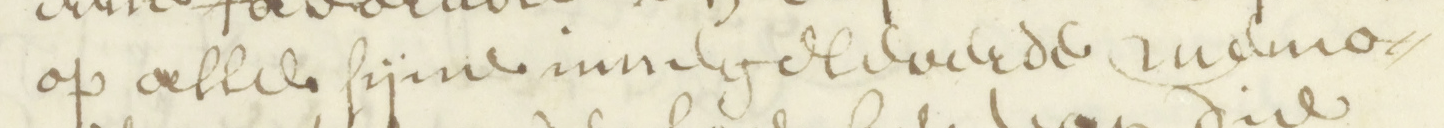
op alle sijne innegeleverde memo,,
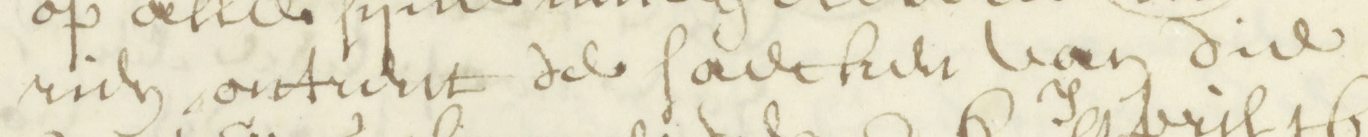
rien ontrent de saecken van die
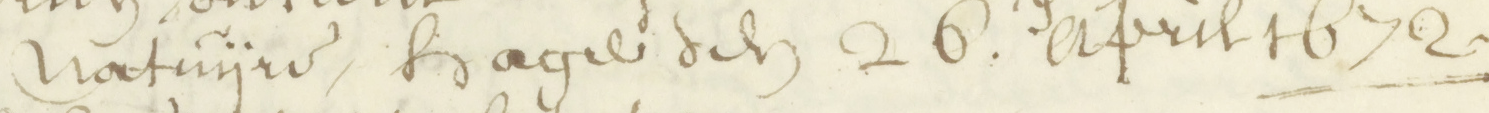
natuijre, Hage den 26.en April 1672
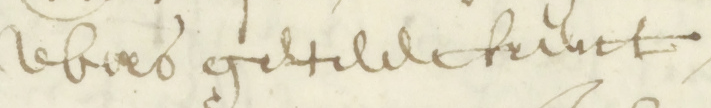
was geteeckent,
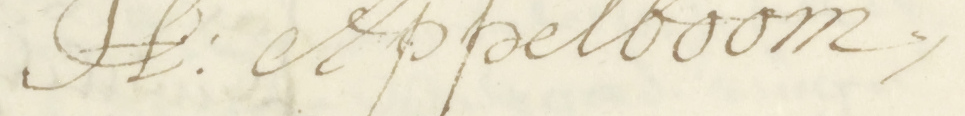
H: Appelboom.
